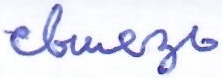свиязь
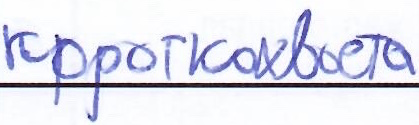крроткохвоста
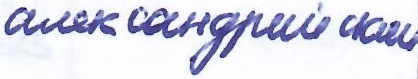александрийскии
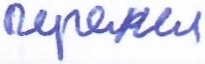перепел
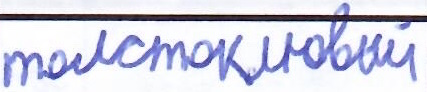толстоклювый
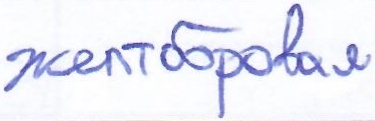желтоборовая
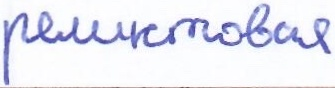реликтовая
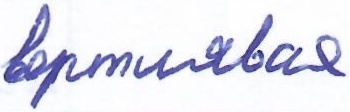вертлявая
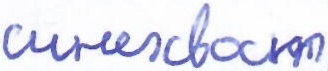синехвост
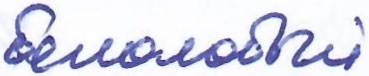белолобый
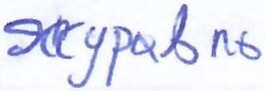журавль
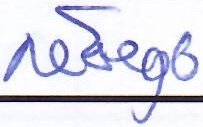лебедь
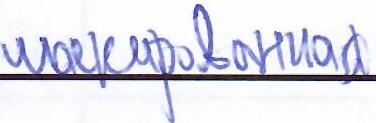маскированная
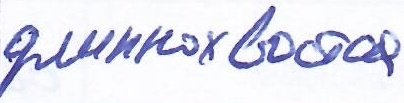длиннохвостая
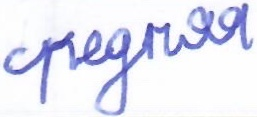средняя
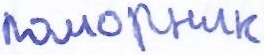поморник
